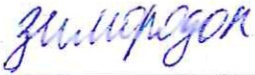зимородок
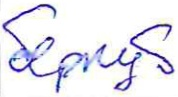беркут
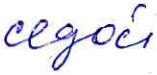седой
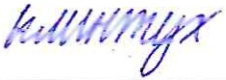клинтух
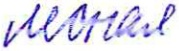лесная
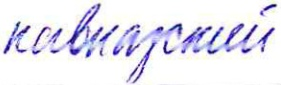кавказский
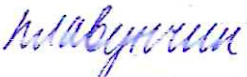плавунчик
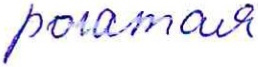рогатая
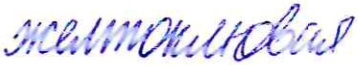желтоклювая
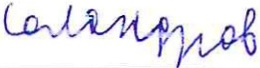соландров
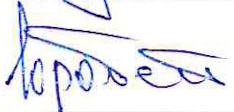воробей
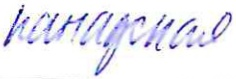канадская
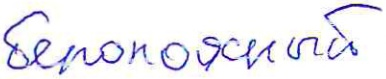белопоясный
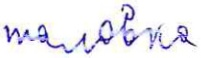таловка
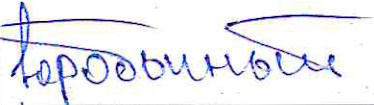воробьиный
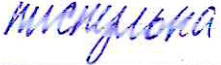пискулька
